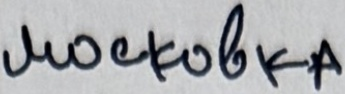московка
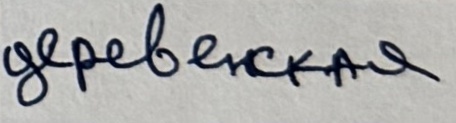деревенская
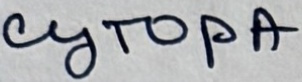сутора
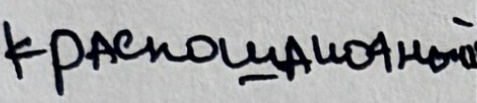красношапочный
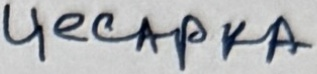цесарка
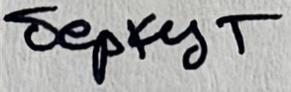беркут
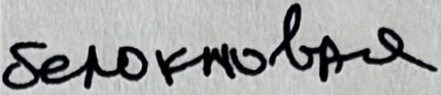белоклювая
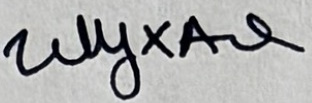глухая
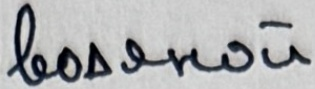водяной
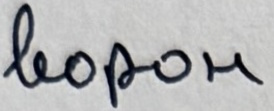ворон
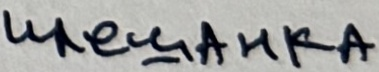плешанка
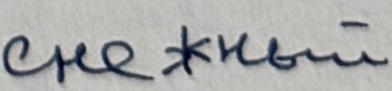снежный
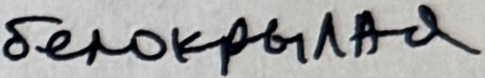белокрылая
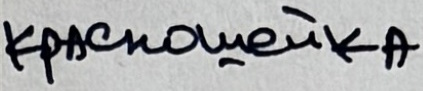красношейка
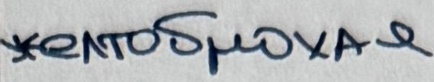желтобрюхая
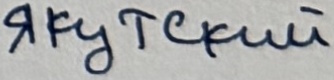якутский
